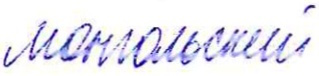монгольский
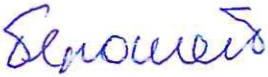белошей
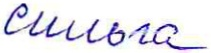синьга
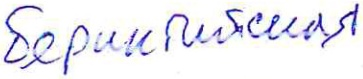берингийская
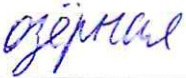озёрная
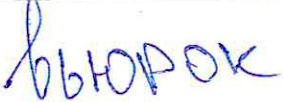вьюрок
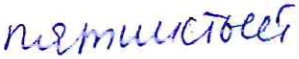пятнистый
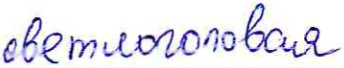светлоголовая
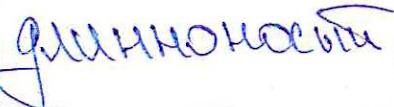длинноносый
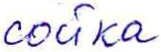сойка
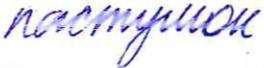пастушок
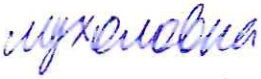мухоловка
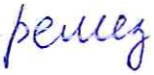ремез
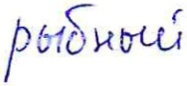рыбный
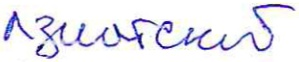азиатский
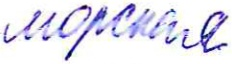морская
